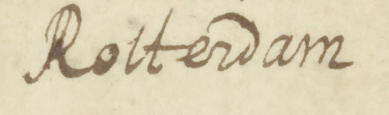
Rotterdam
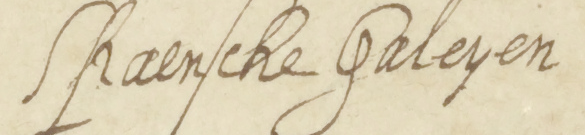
Spaensche Galeyen
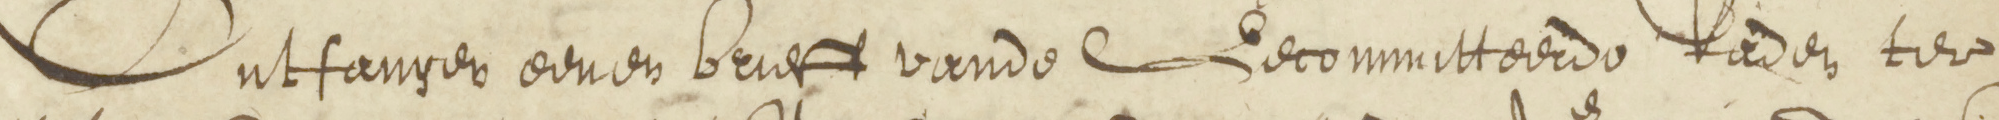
Ontfangen eenen brieff vande Gecommitteerde Raden ter
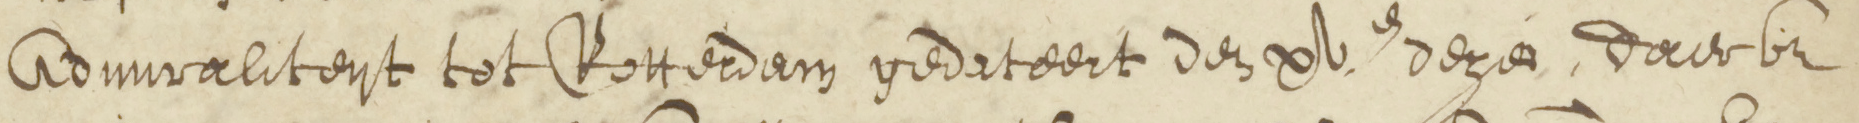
Admiraliteyt tot Rotterdam gedateert den xven. dezes, daerby
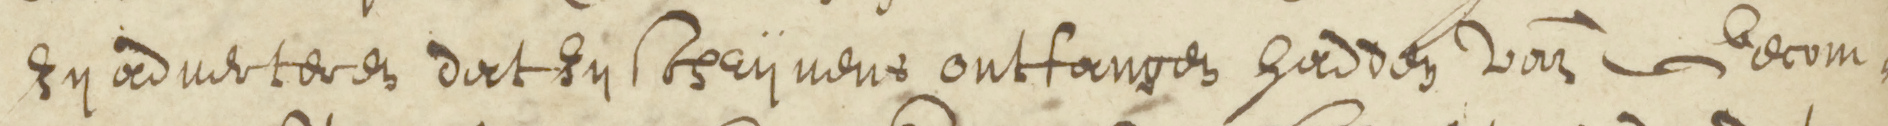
zy aduerteren dat zy schrijuens ontfangen hadden van Gecom,,
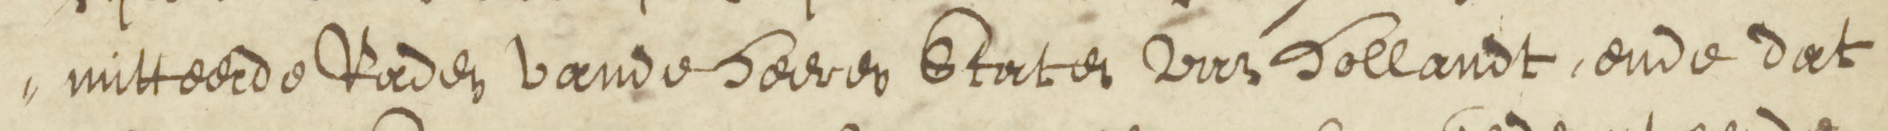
,,mitteerde Raden vande heeren Staten van Hollandt, ende dat
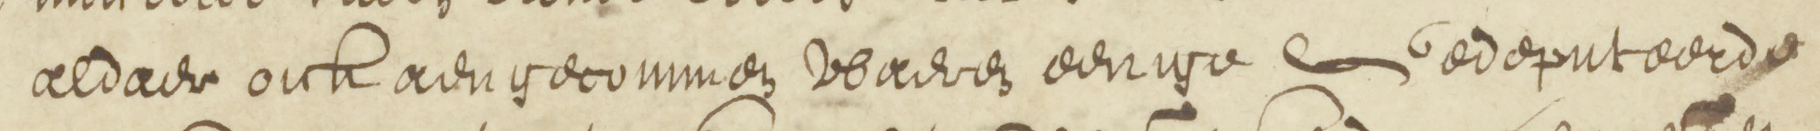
aldaer oick aen gecommen waeren eenige Gedeputeerde
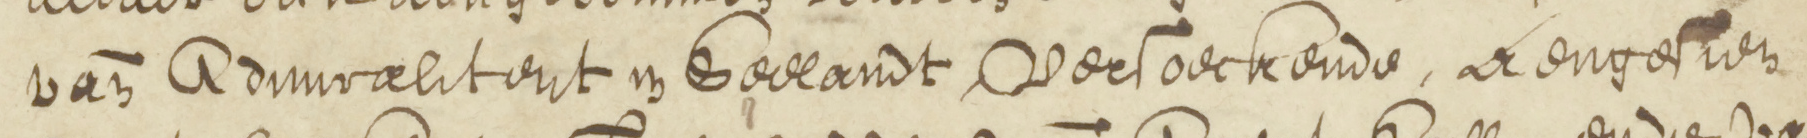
van Admiraliteyt in Seelandt, versoeckende, aengesien
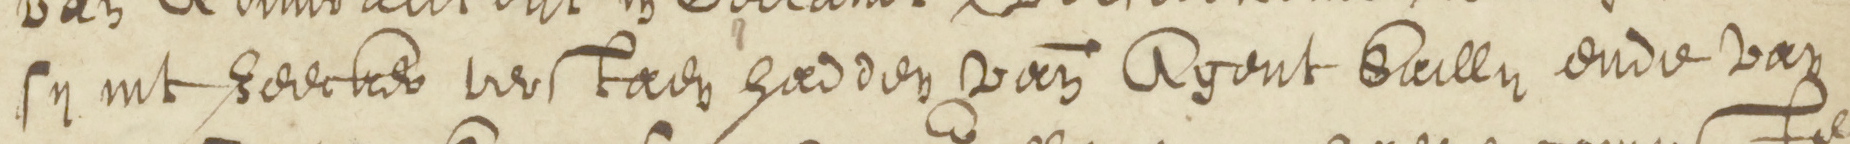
sy int zeecker verstaen hadden van Agent Sailly ende van
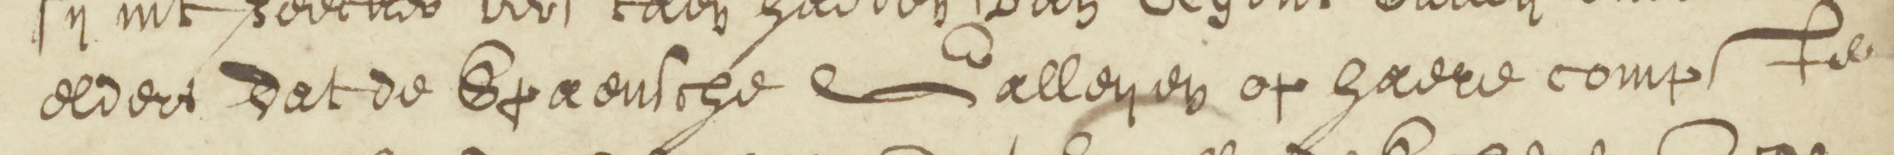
elders dat de Spaensche Galleyen op haere compste
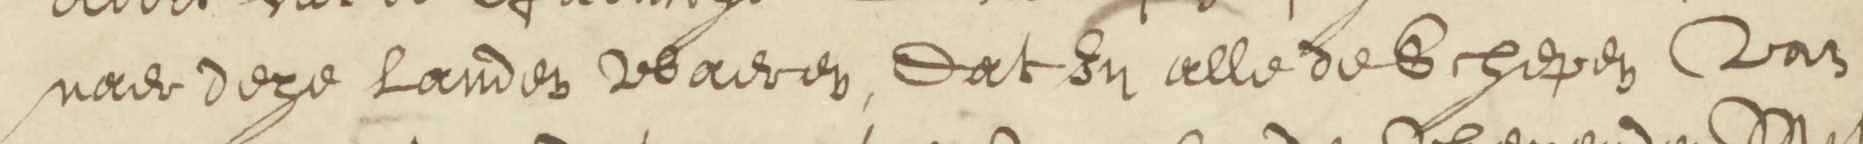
naer deze landen waeren, dat zy alle de Schepen van
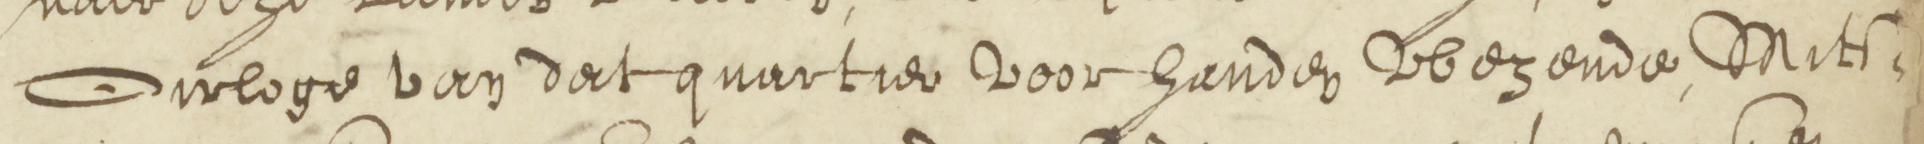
Oirloge van dat quartier voor handen wezende, Mits,,
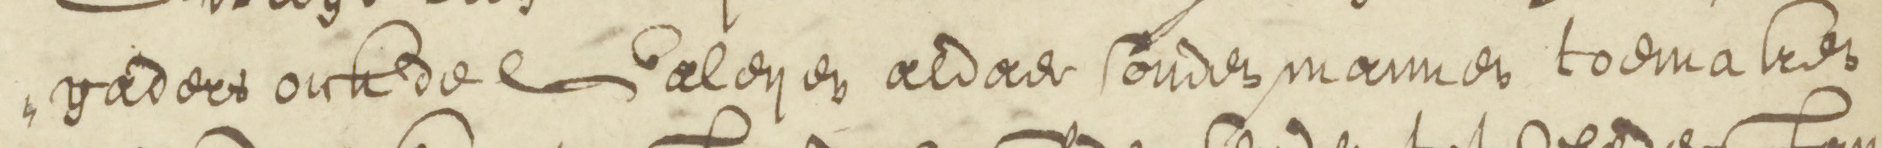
,,gaders oick de Galeyen aldaer souden mannen toemaken
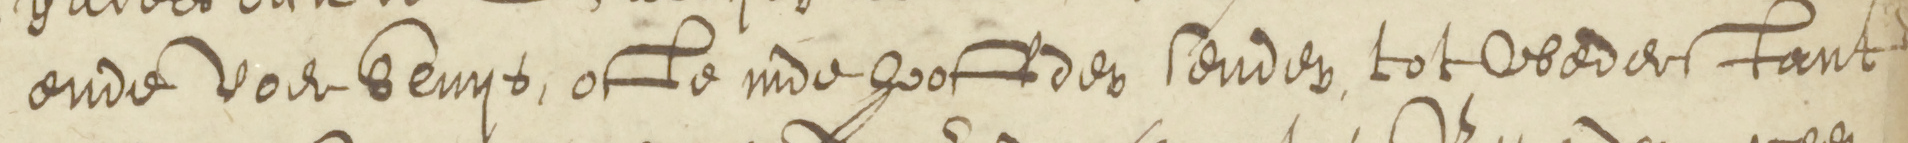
ende voer Sluys, ofte inde hooffden senden, tot wederstant
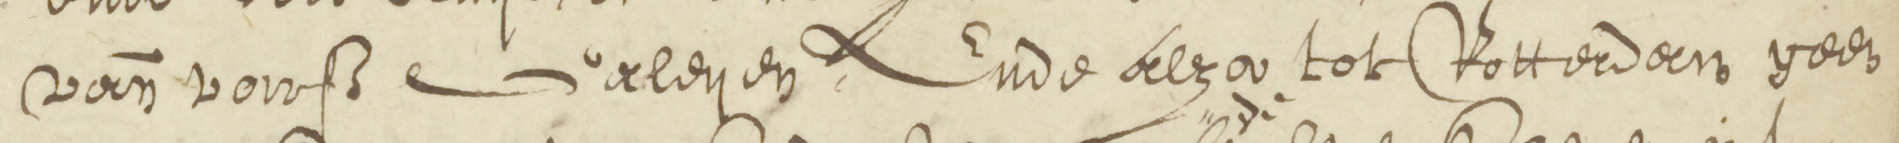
van voirs Galeyen. Ende alzoo tot Rotterdam geen
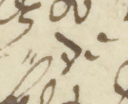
,,de
